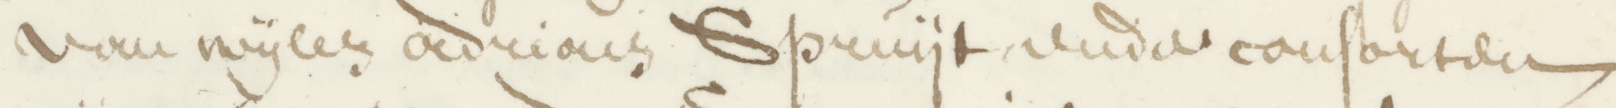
van wijlen adriaen Spruijt, ende consorten,
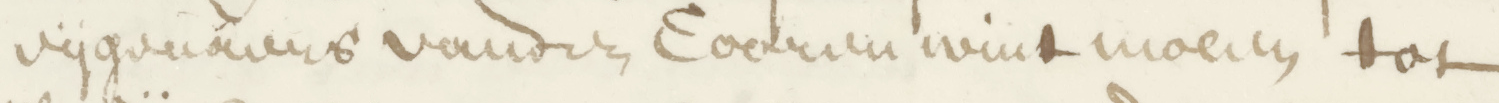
eijgenaers vanden Cooren wint molen tot
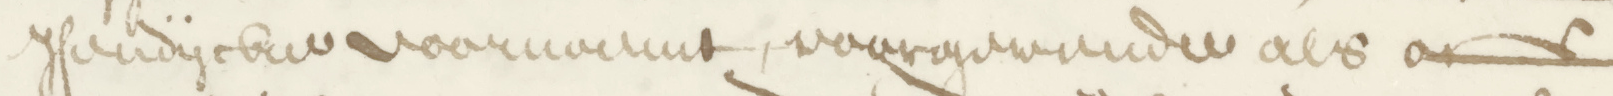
Isendijcke voornoemt, voorgevende als off
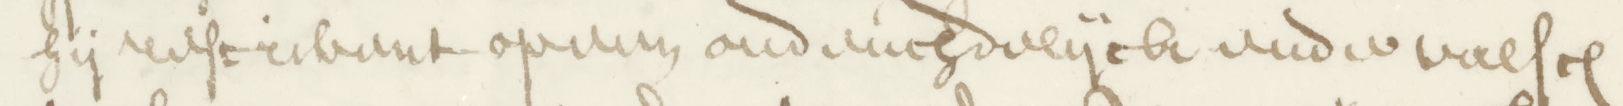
hij rescribent opeen ondeuchdelijck ende valsch
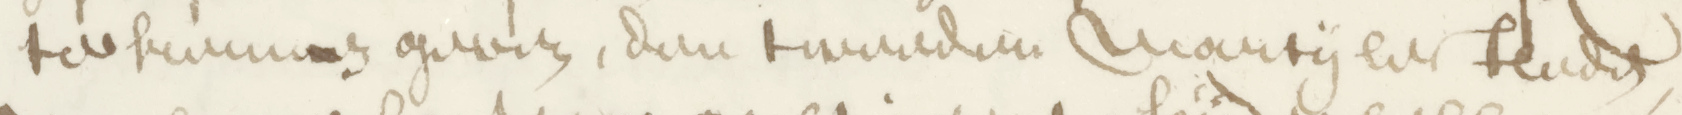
te kennen geven, den tweeden Martij lestleden,
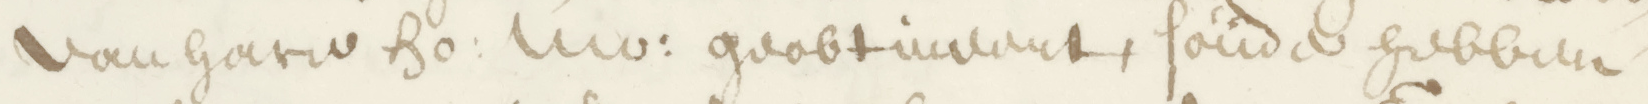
van hare ho:Mo: geobtineert, soude hebben
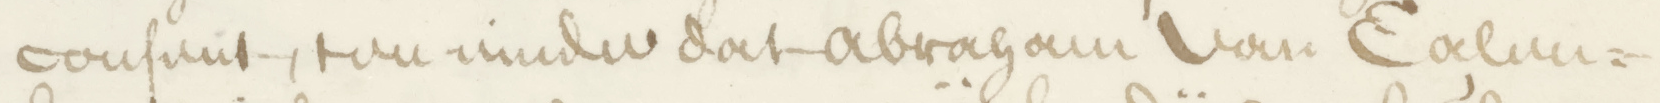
consent, ten einde dat Abraham van Calen=
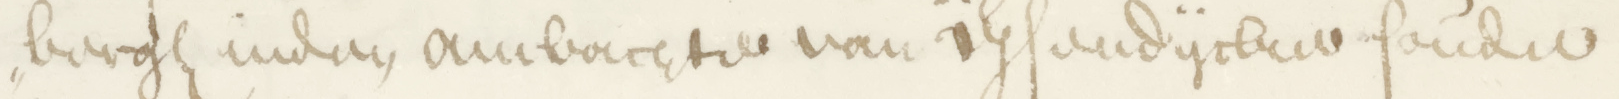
„bergh inden Ambachte van IJsendijcke soude
